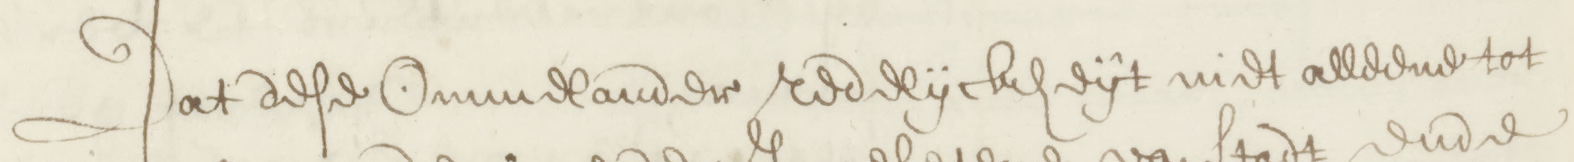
Dat dese Ommelander redelijckheijt niet alleene tot
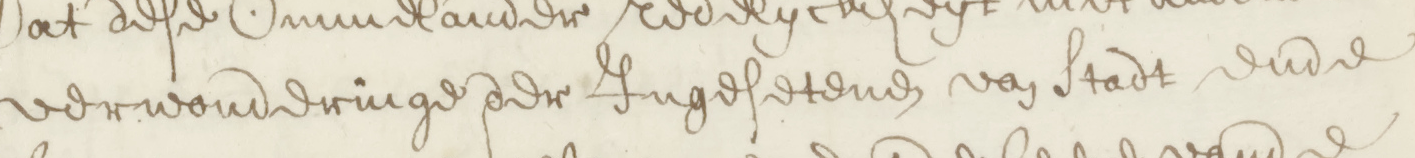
verwonderinge der Ingesetenen van Stadt ende
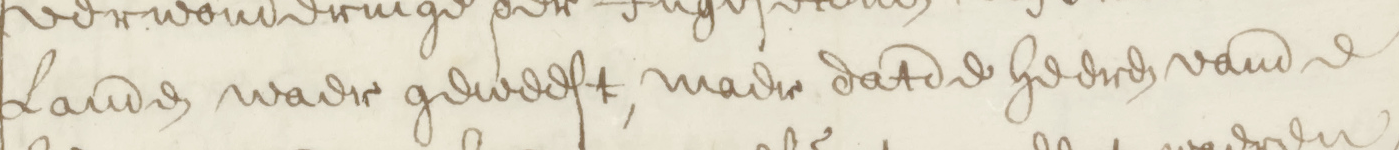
Landen waer geweest, maer dat de heeren vande
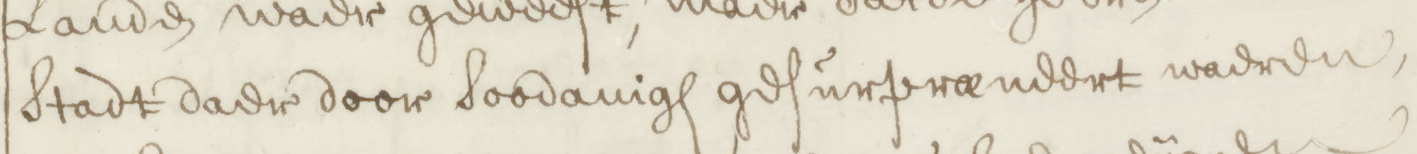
Stadt daer door soodanigh gesurpræneert waeren,
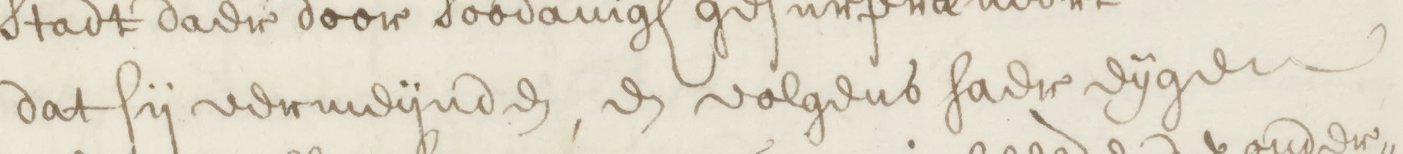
dat sij vermeijnden, en volgens haer eijgen
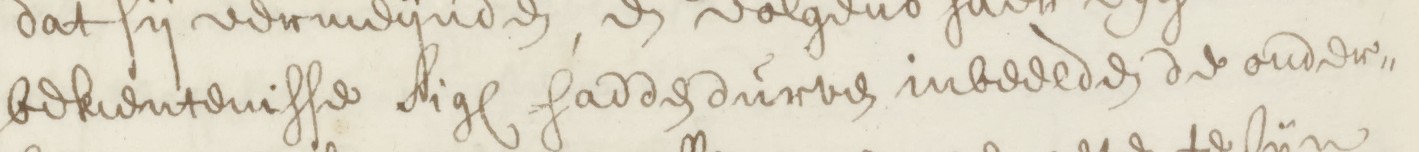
bekentenisse sigh hadden durven inbeelden de onder„
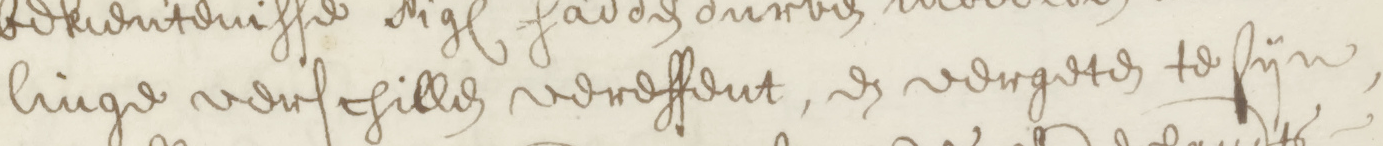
linge verschillen vereffent, en vergeten te sijn,
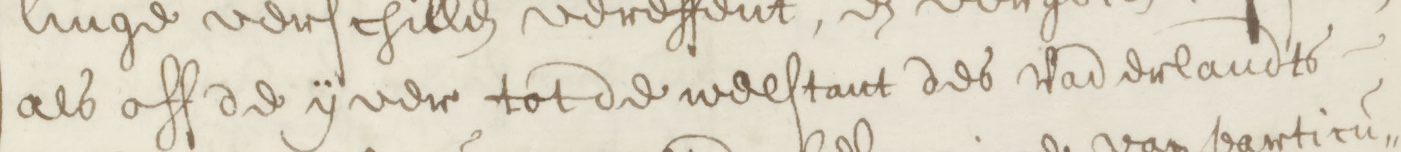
als off de ijver tot de welstant des Vaderlandts-
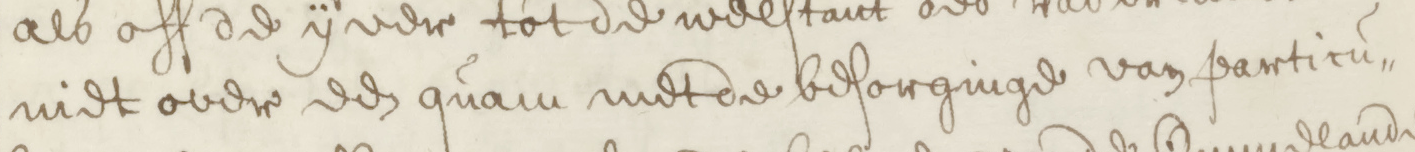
niet over een quam met de besorginge van particu„
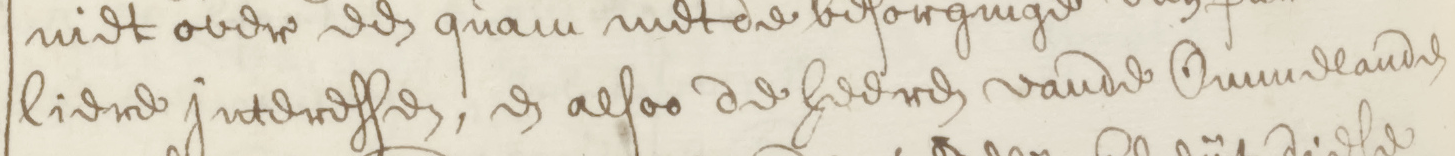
„liere interessen, en alsoo de heeren vande Ommelanden
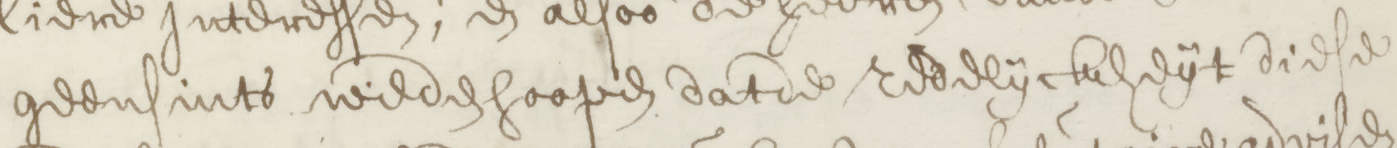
geensints wilden hoopen dat de redelijckheijt diese
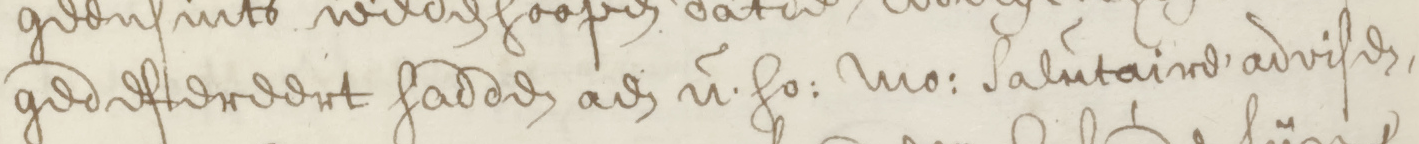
gedefereert hadden aen u. ho:Mo: Salutaire advisen,
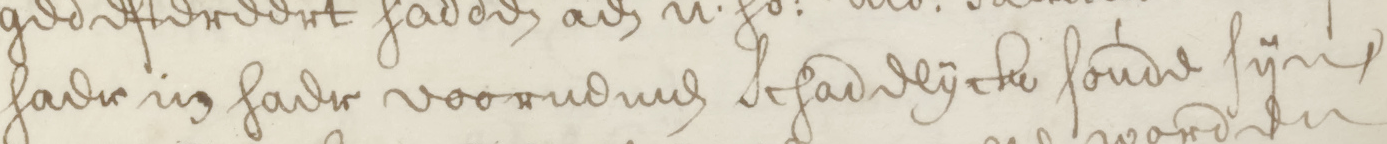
haer in haer voornemen schadelijck soude sijn,
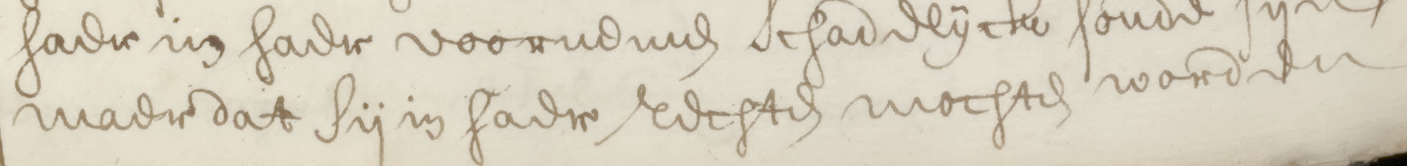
maer dat sij in haer rechten mochten worden
